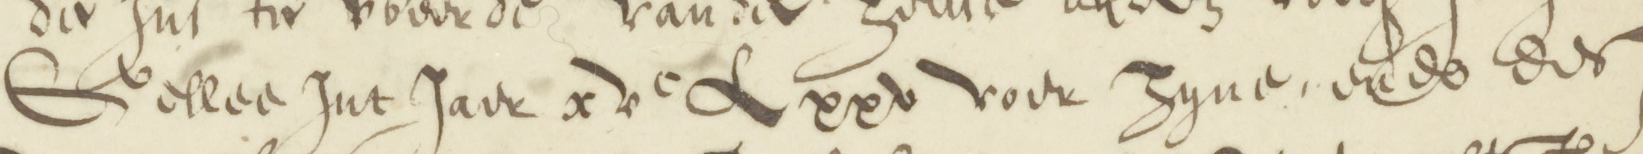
Gellee Int Jaer xvCLxxv voer zyne, ende des
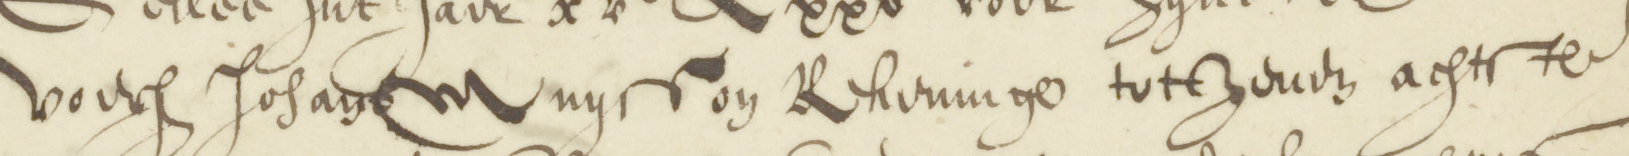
voers Johans Muysson Rekeninge tot zeuen achtste
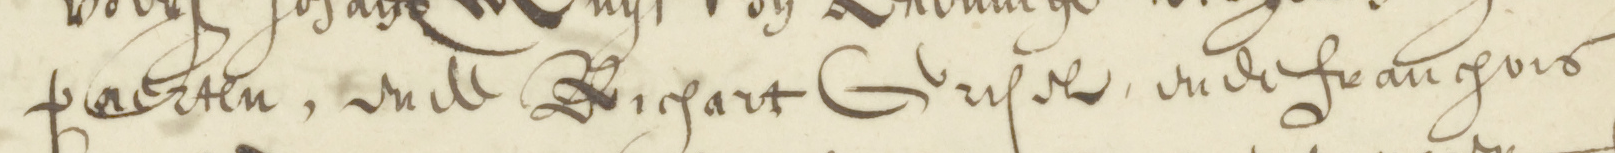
paerten, ende Richart Grisel, ende franchois
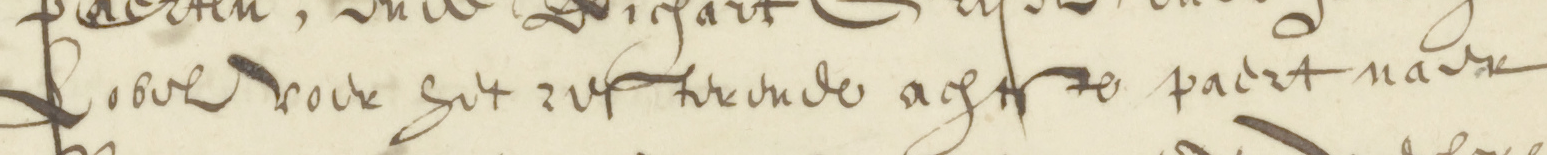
Lobel voer het resterende achtste paert naer
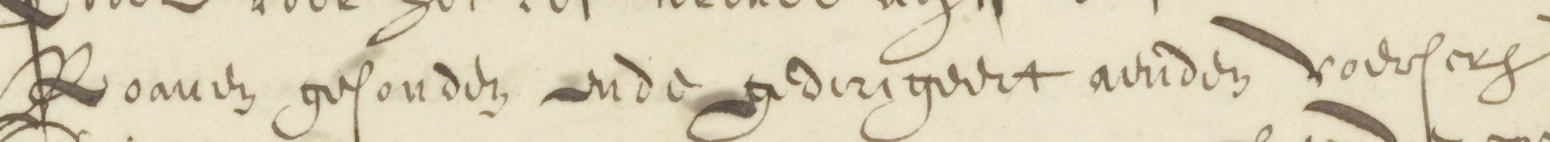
Roanen gesonden ende gedirigeert aenden voerscr
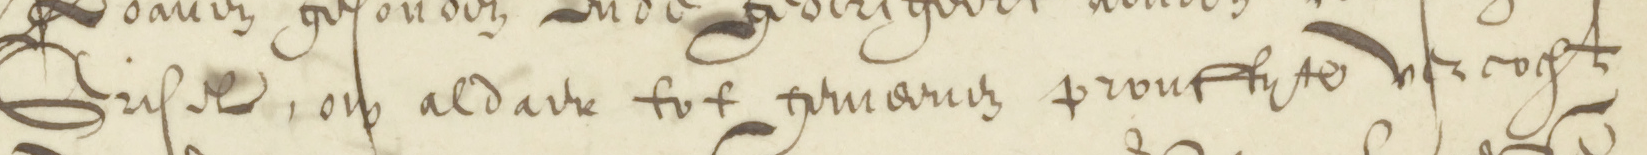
Grisel, om aldaer tot gemeenen prouffyte vercocht
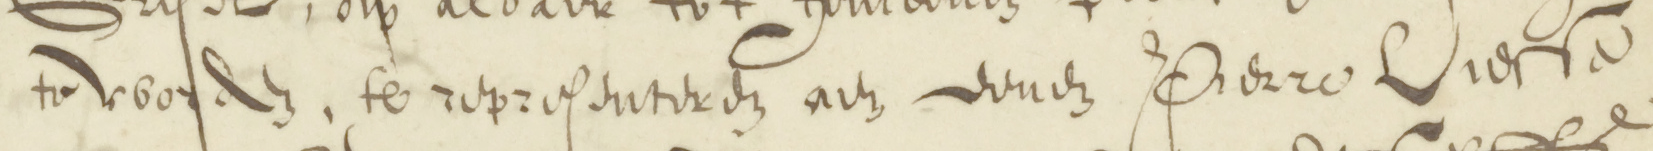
te worden, te representeren aen eenen Pierre Liesse
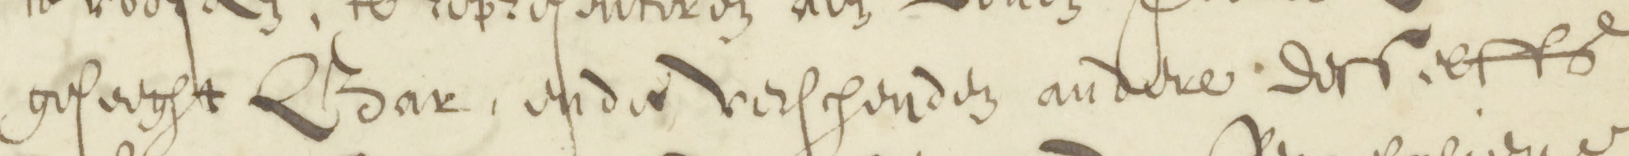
geseeght Bar, ende verscheyden andere desselffs
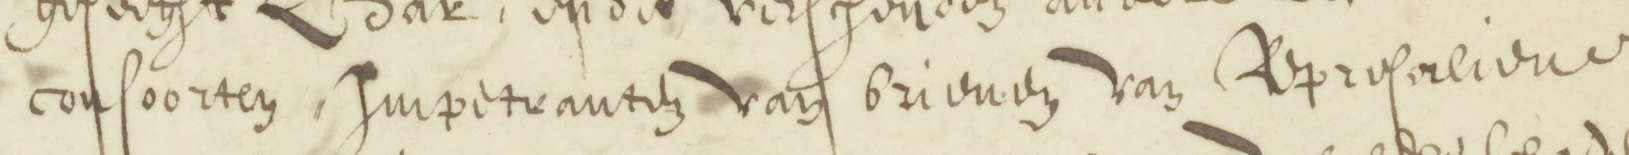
consoorten, Impertranten van brieven van represaliene,
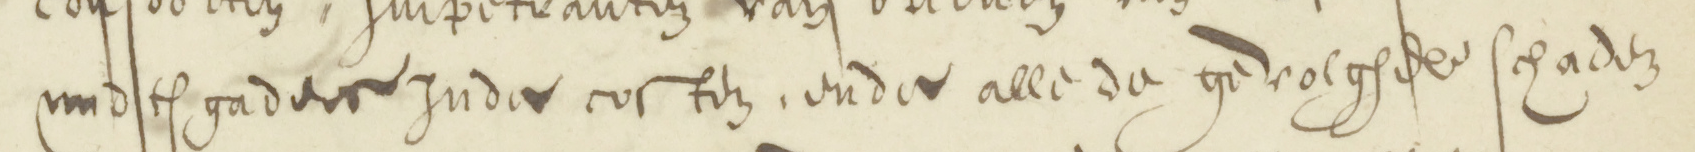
midtsgaders Inde costen, ende alle de gevolghde schaden
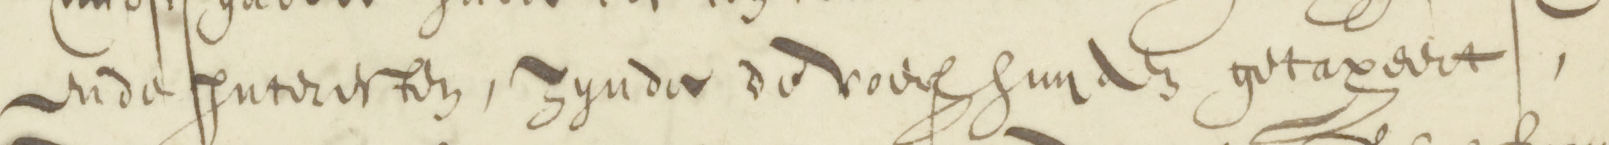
ende Interesten, zynde de voers huyden getaxeert,
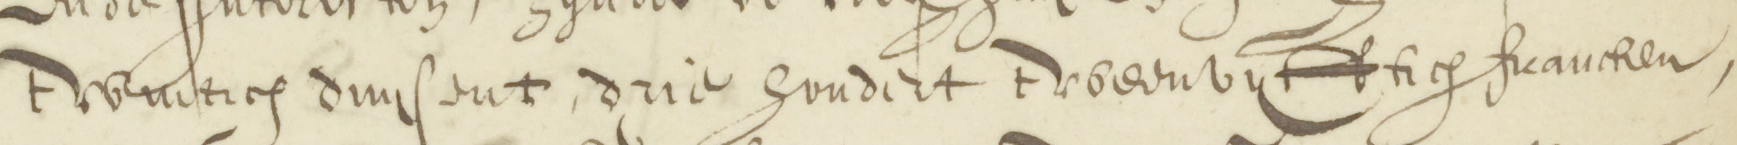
twintich duysent, drie hondert tweenvyfftich francken,
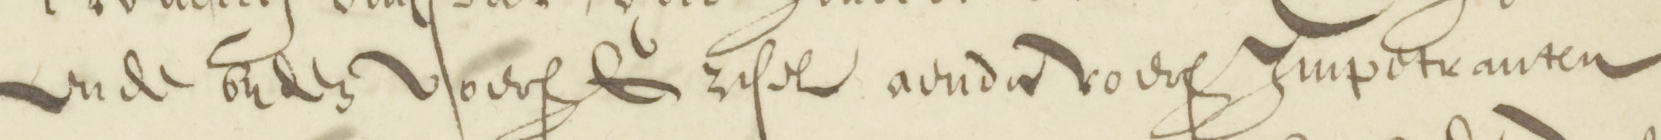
ende byden voers Grisel aende voers Impetranten
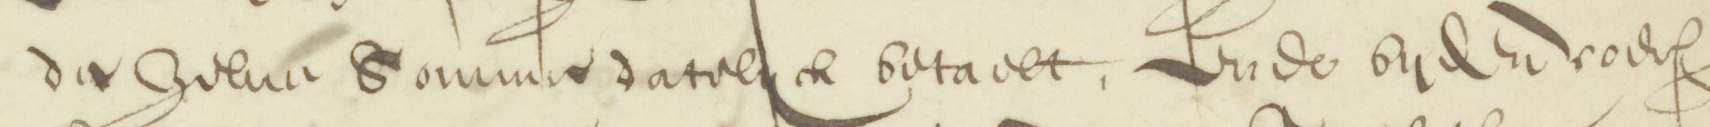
de zelve Somme datelyck betaelt, Ende byden voers
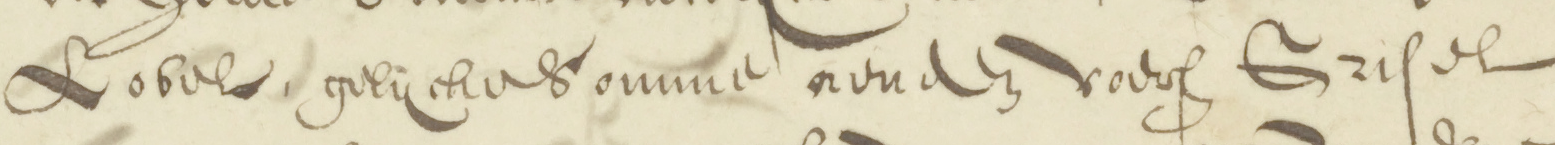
Lobel, gelycke Somme aenden voers Grisel
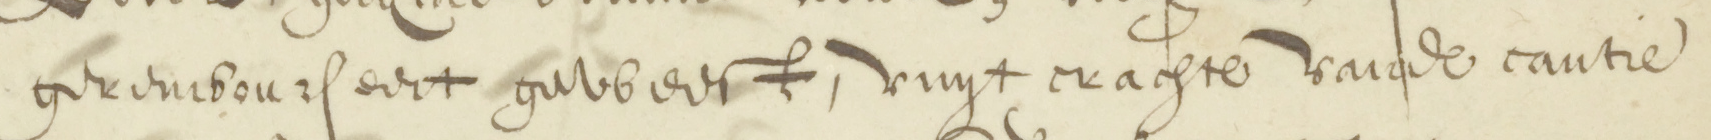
gerembourseert geweest, vuyt crachte vande cautie
